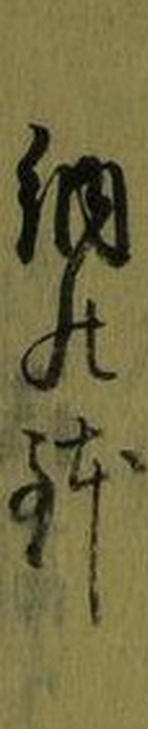納の鉢
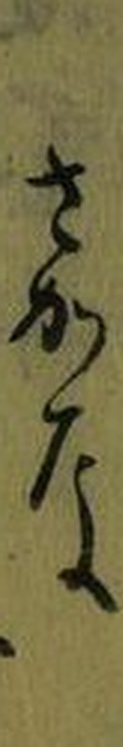さかな
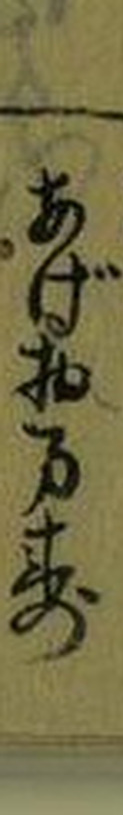あげ物万寿
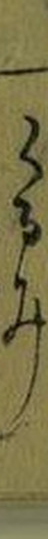くるみ
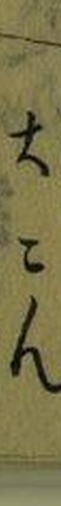大こん
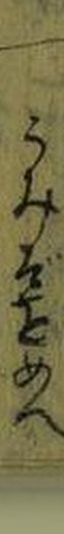うみぞをめん
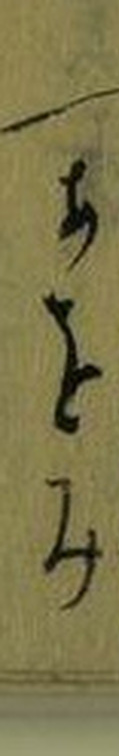あをみ
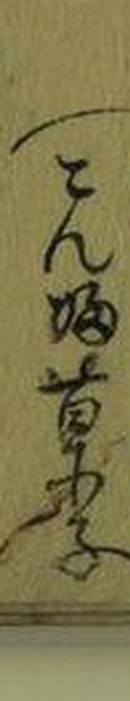こんふ菓子
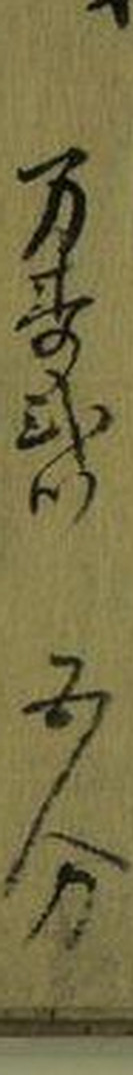万寿弐ツ五分

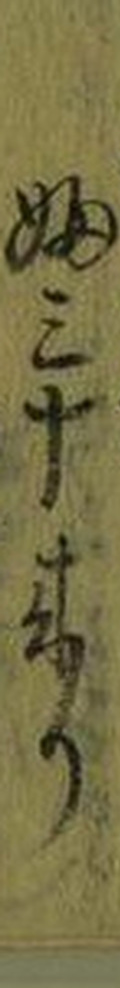ふ三十来り
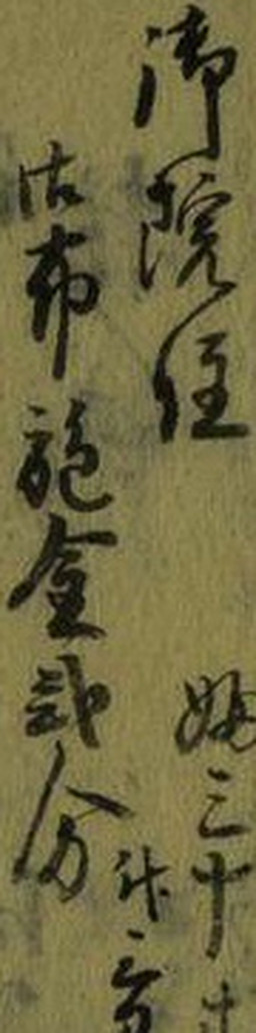御布施金弐分
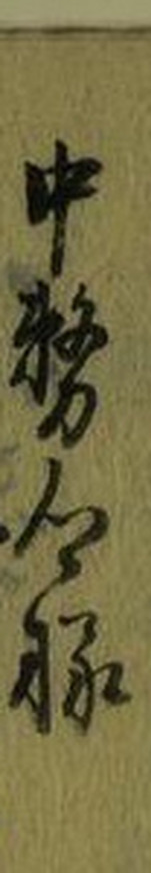中務卿様
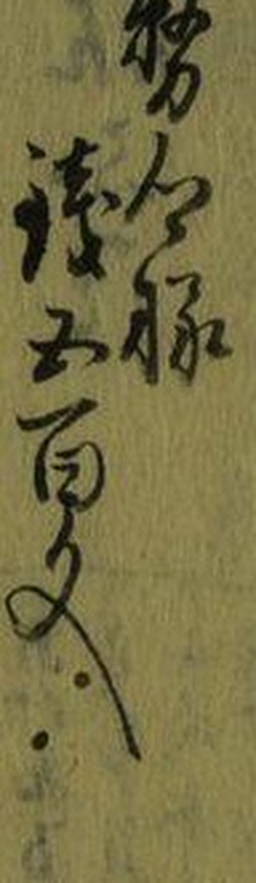銭五百文
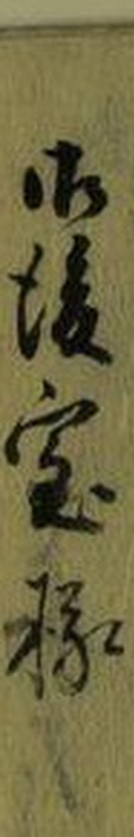御後室様
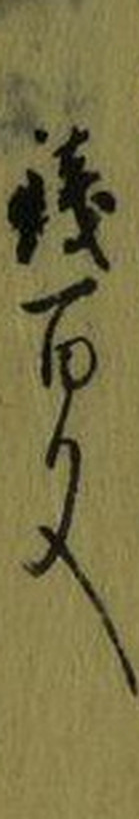銭百文
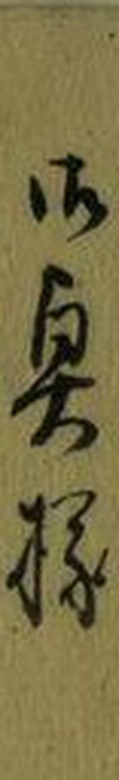御奥様
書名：（献立覚）
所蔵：福井県文書館 Fukui Prefectural Archives
